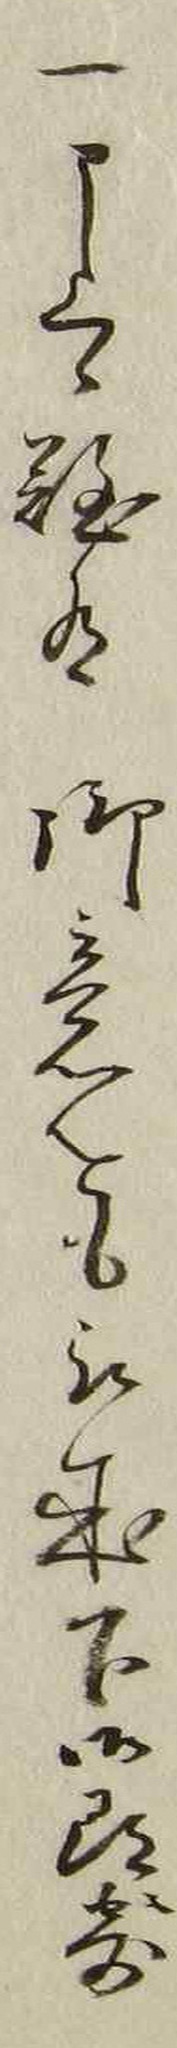一申上候難有御意をも被成下御尋ニ寄
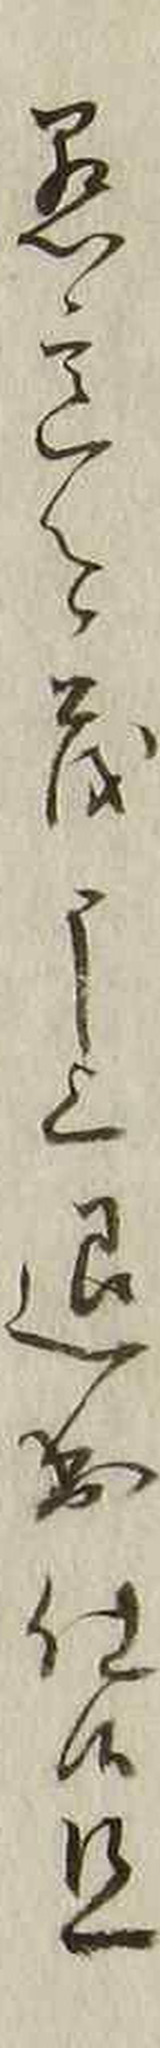愚意を茂申上退出仕候且
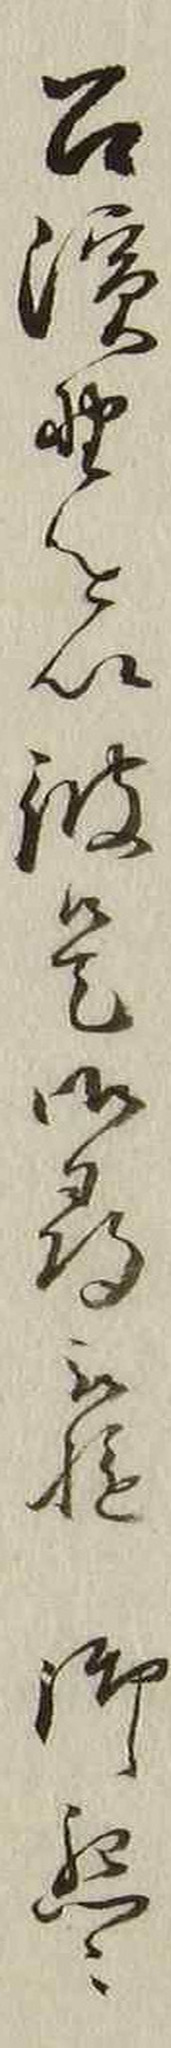召浜野を以彼是御尋被遊御懇之
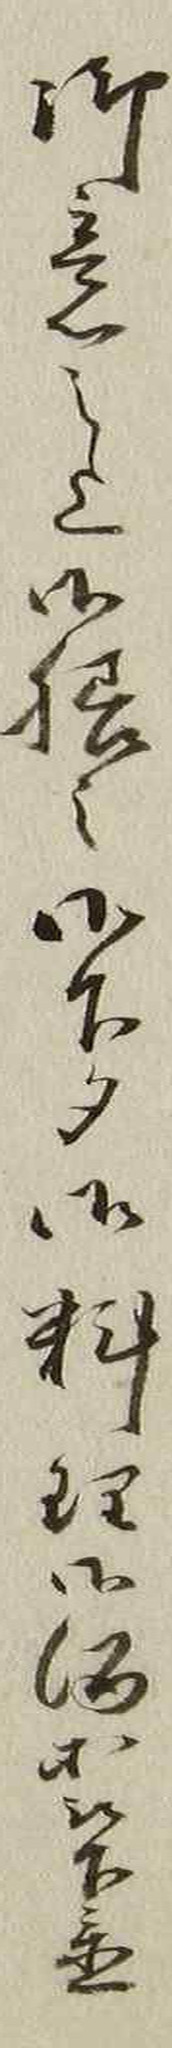御意之上御膳之御下タ御料理御酒等被下置
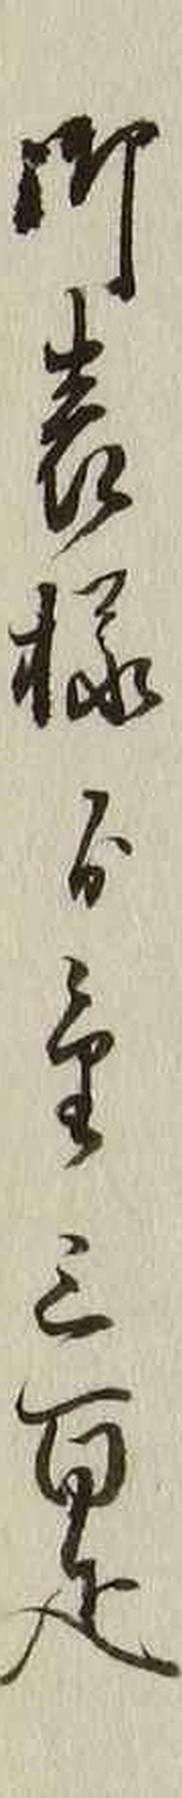御表様ゟ金三百疋
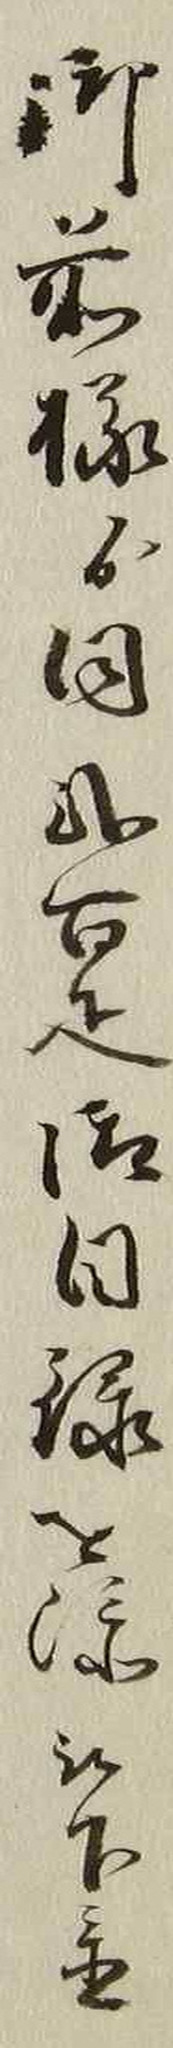御前様ゟ同弐百疋御目録を添被下置
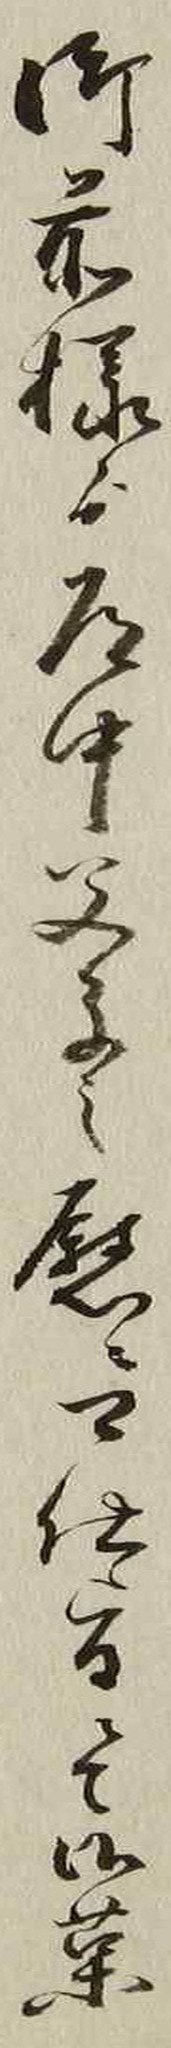御前様ゟ道中父子之慰ニ可仕旨ニて御菓
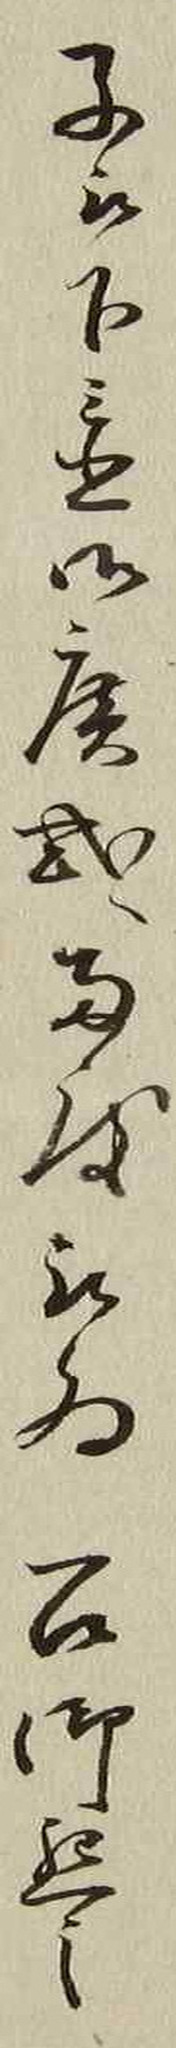子被下置御広式へ両度被為召御懇之
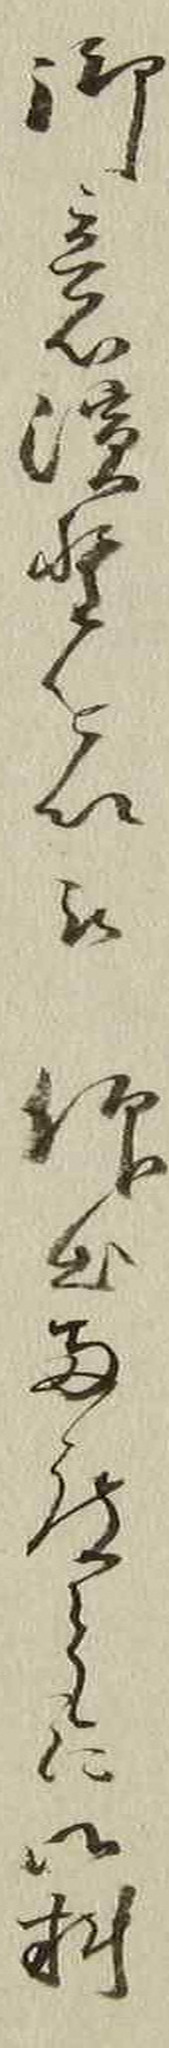御意浜野を以被仰出両度ともに御料
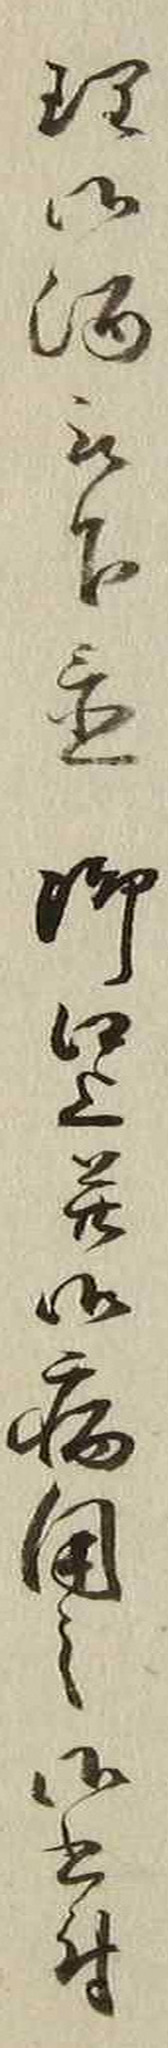理御酒被下置御口上并御病用之御書付
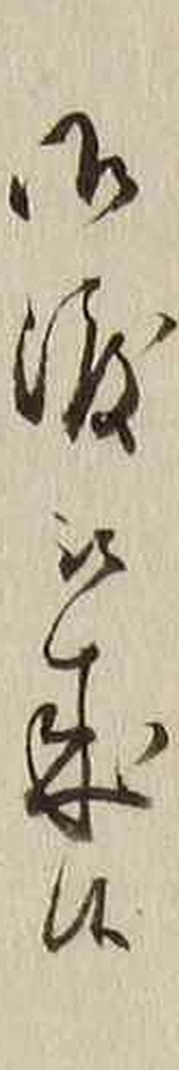御渡被成候
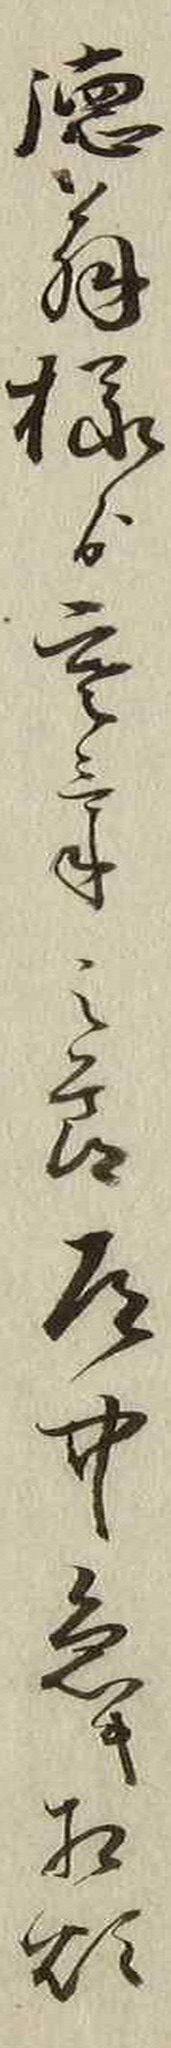徳翁様ゟ寒気之節道中急キ相煩
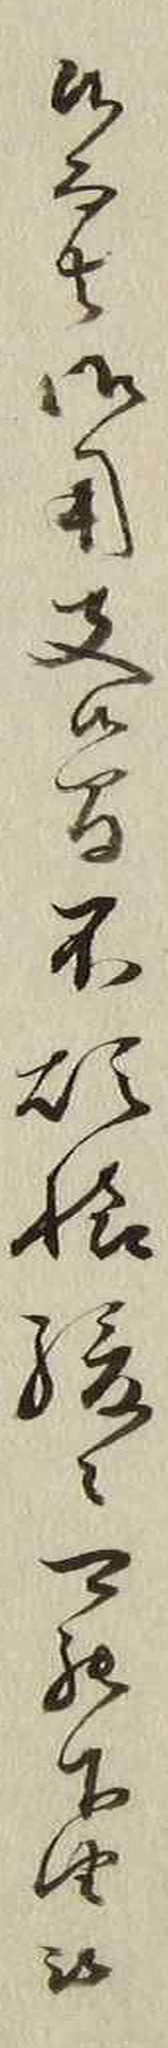候而者御用支候間不煩様緩々可罷下由被
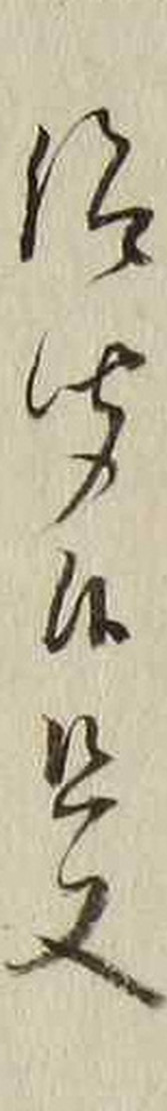仰聞候且又
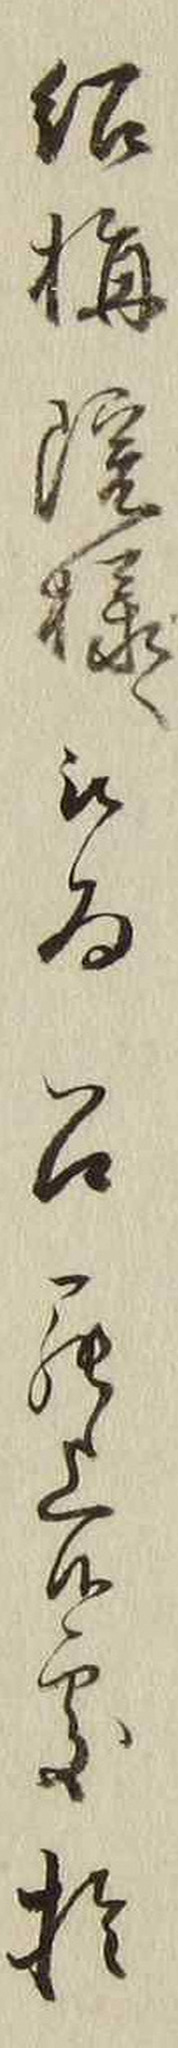紹栴院様へ被為召罷上候処於
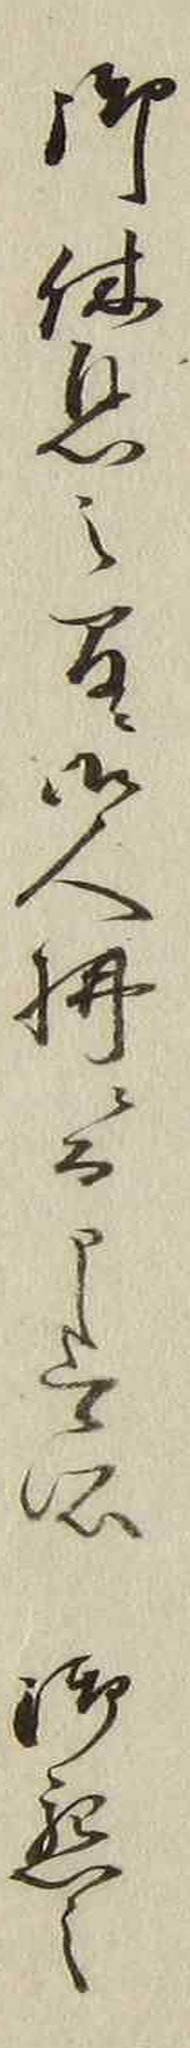御休息之間ニ御人払ニ而申上候所御懇之
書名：諸士系譜　巻之28　い之部28
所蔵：会津若松市立会津図書館
